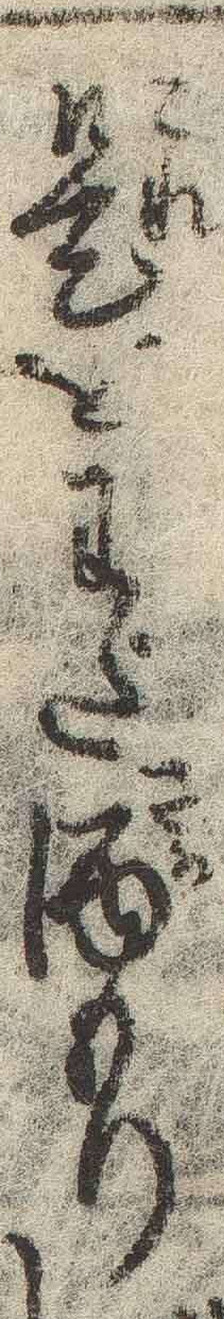是をわだ酒もりと
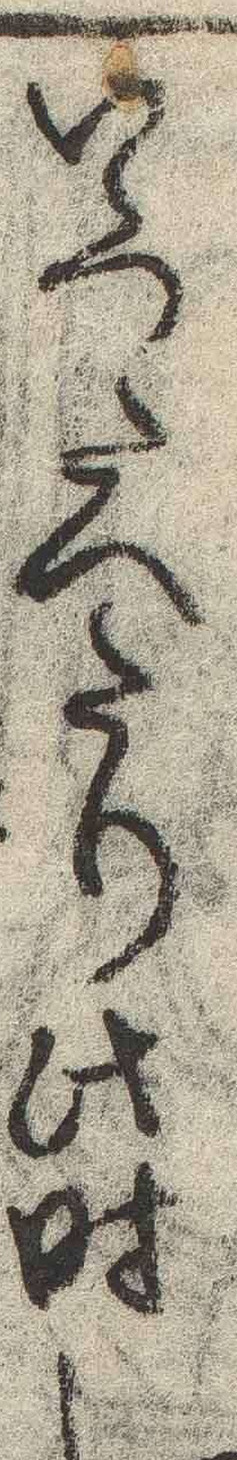いゝつたへたり此時
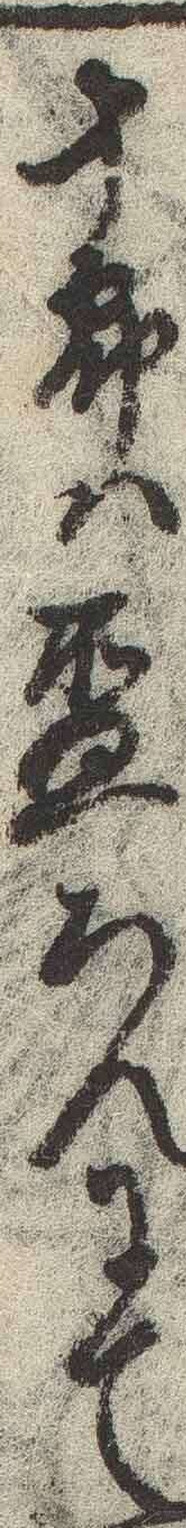十郎は盃ろんにて
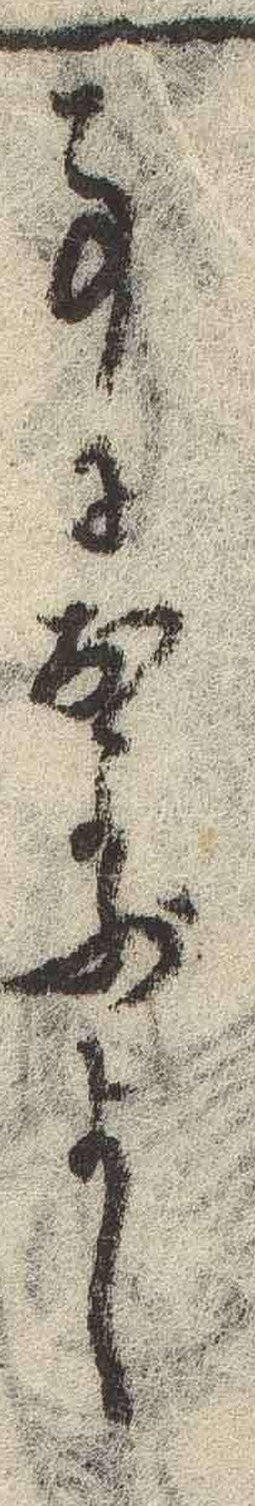事におよぶよし
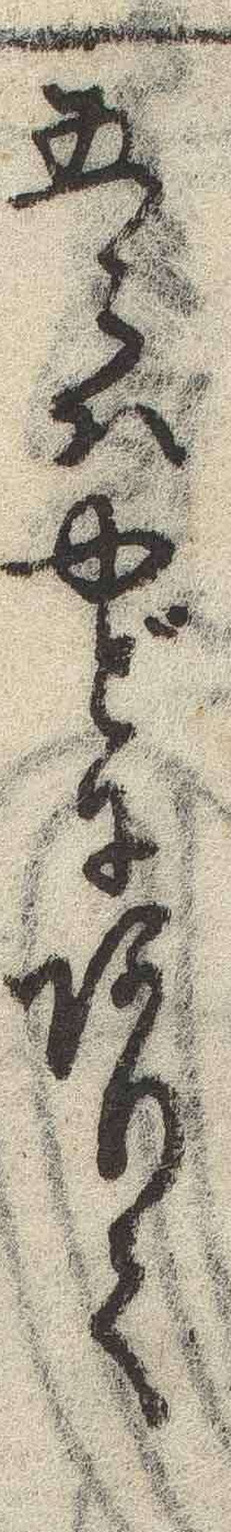五郎はやどにありて
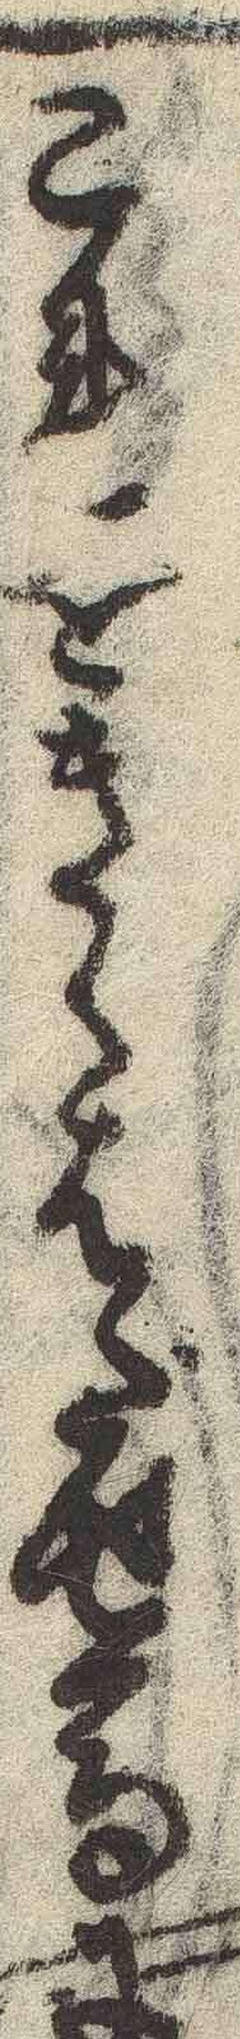これをきゝはだせ馬に
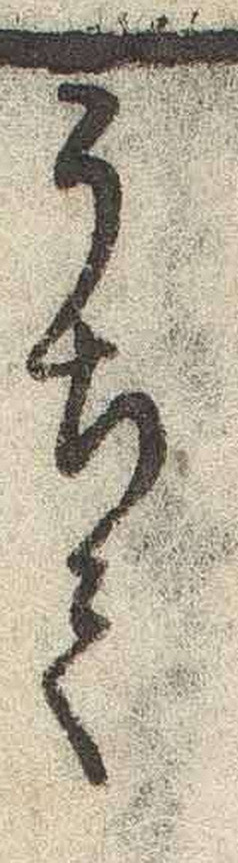うちて
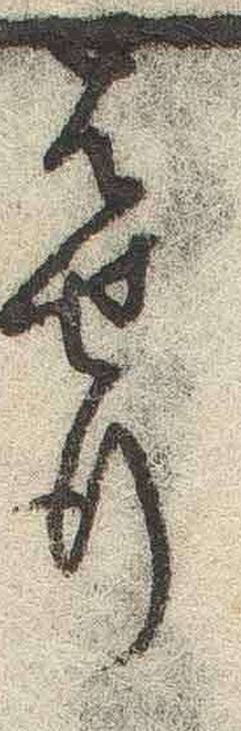はせ行
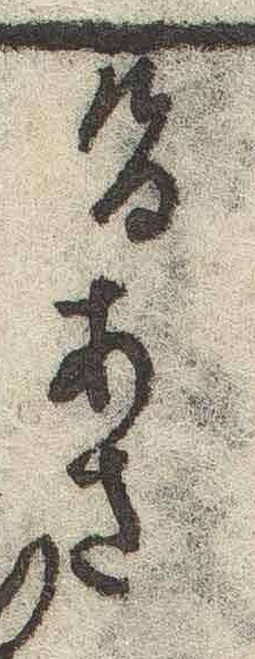けるあさ
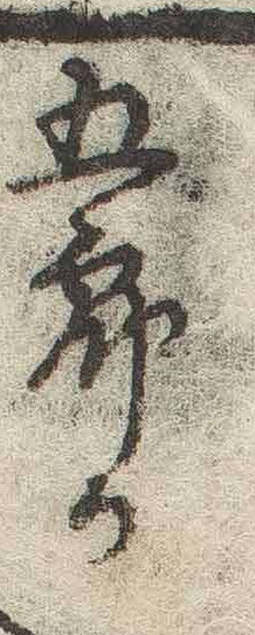五郎か
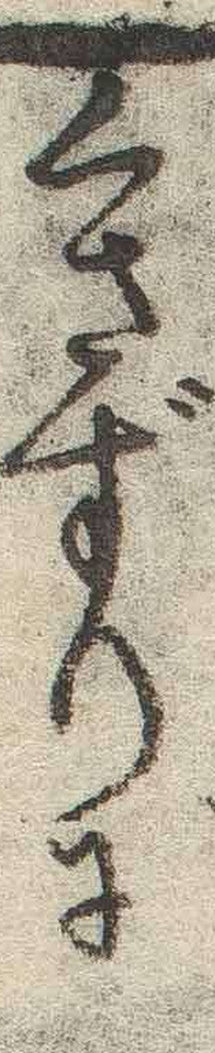くさずりに
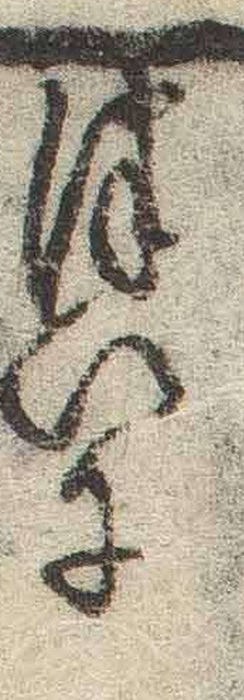ついに

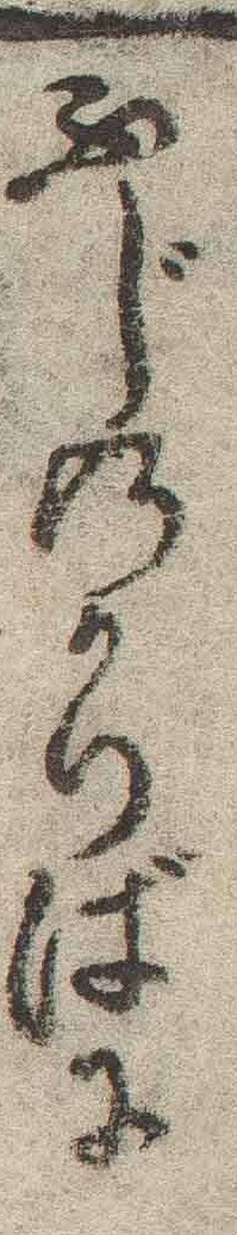ふじのかりばに
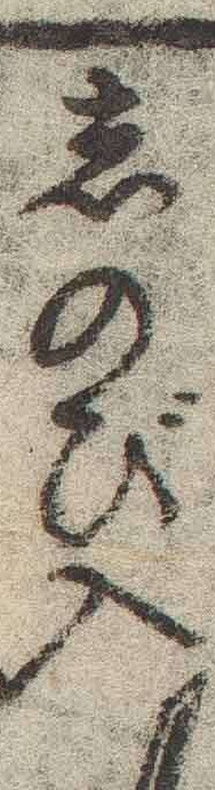しのび入
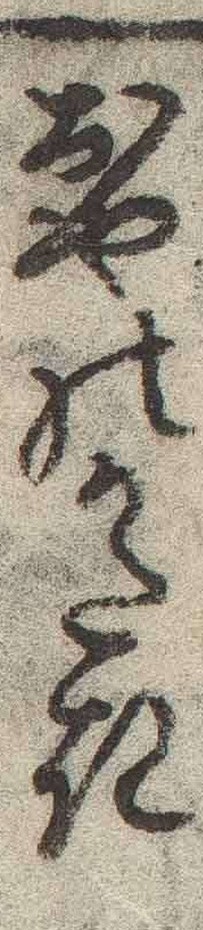おやのかたき
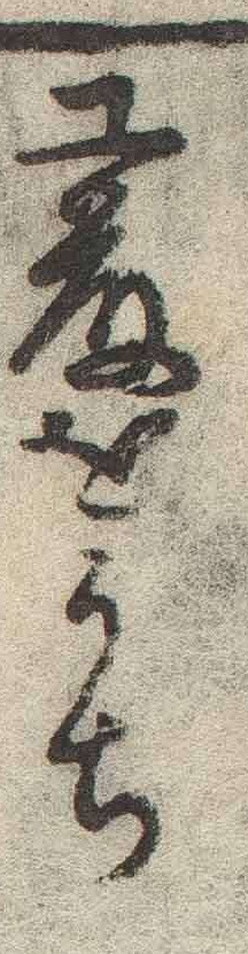工藤をうち
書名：末広扇
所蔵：東京学芸大学附属図書館 国文学研究資料館
